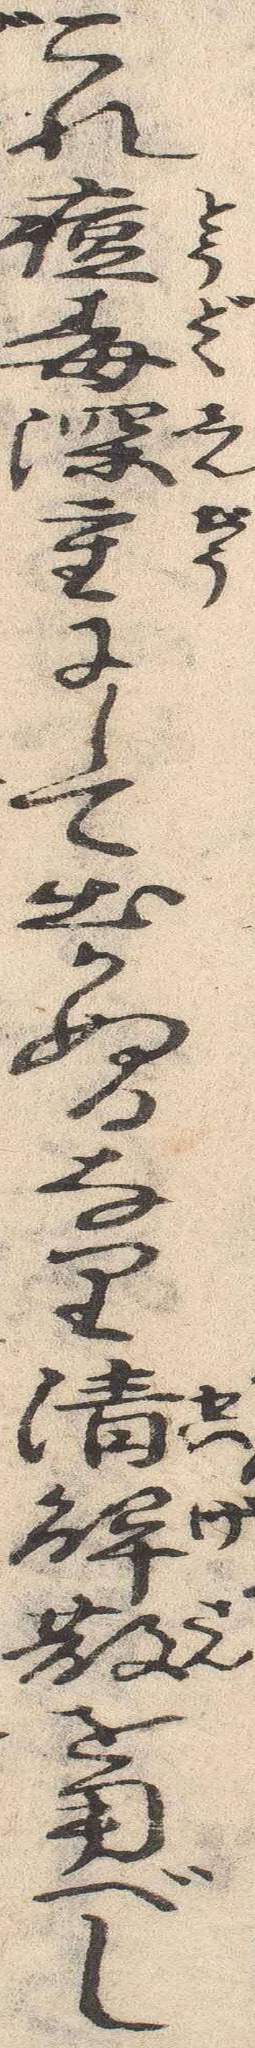これ痘毒深重にして出かぬるなり清解散を用べし
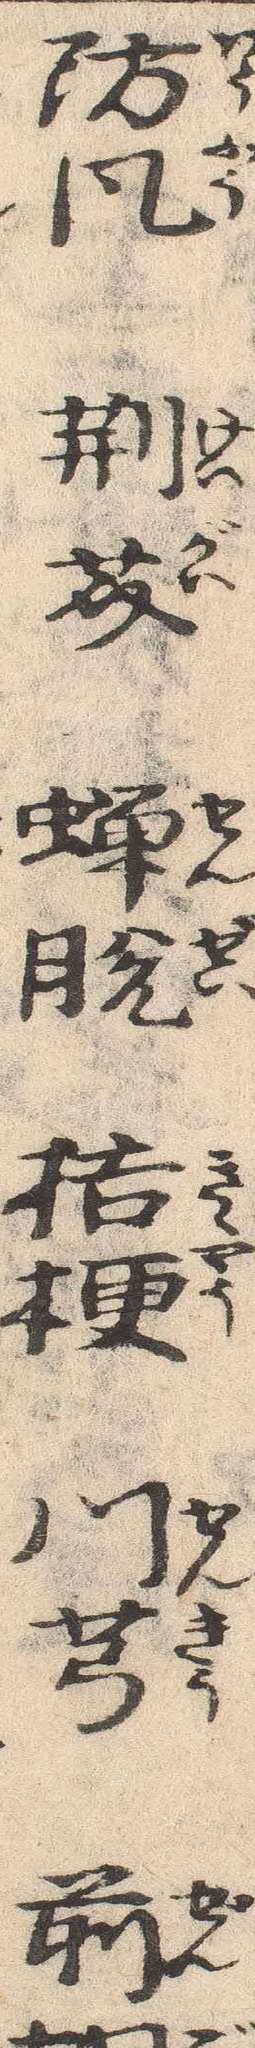防風荊芥蝉脱桔梗川芎前胡
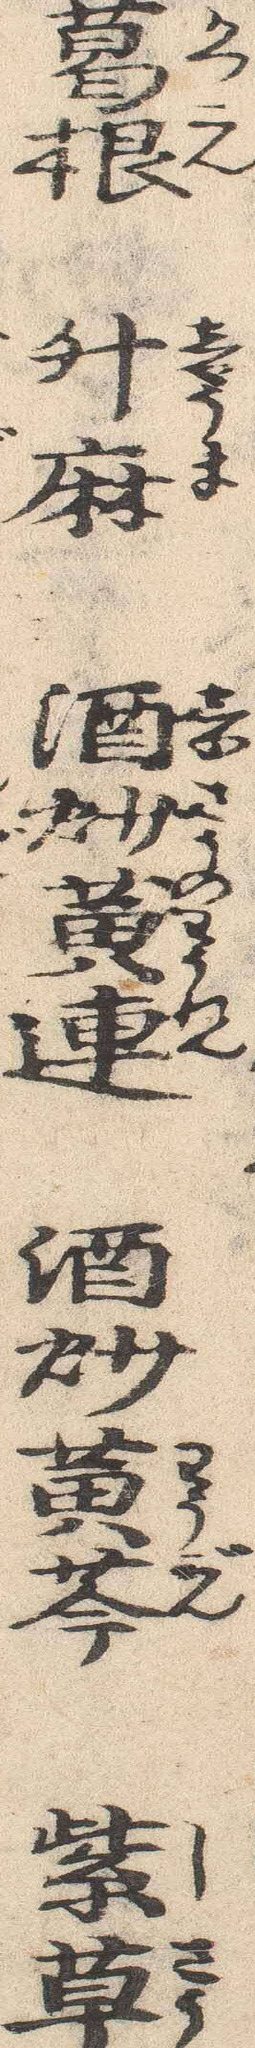葛根升麻酒炒黄連酒炒黄芩紫草
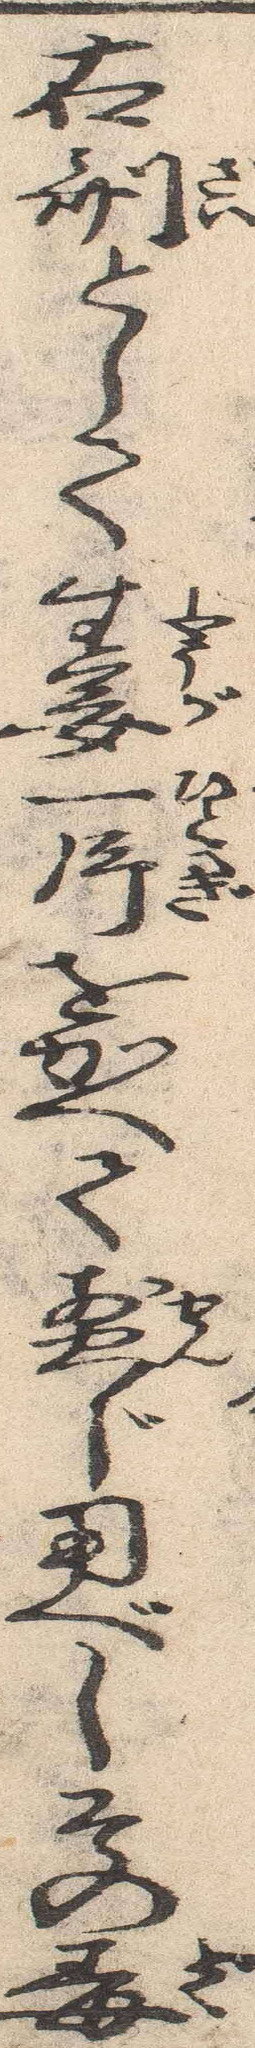右剤として生姜一片を加へて煎じ用べしその毒
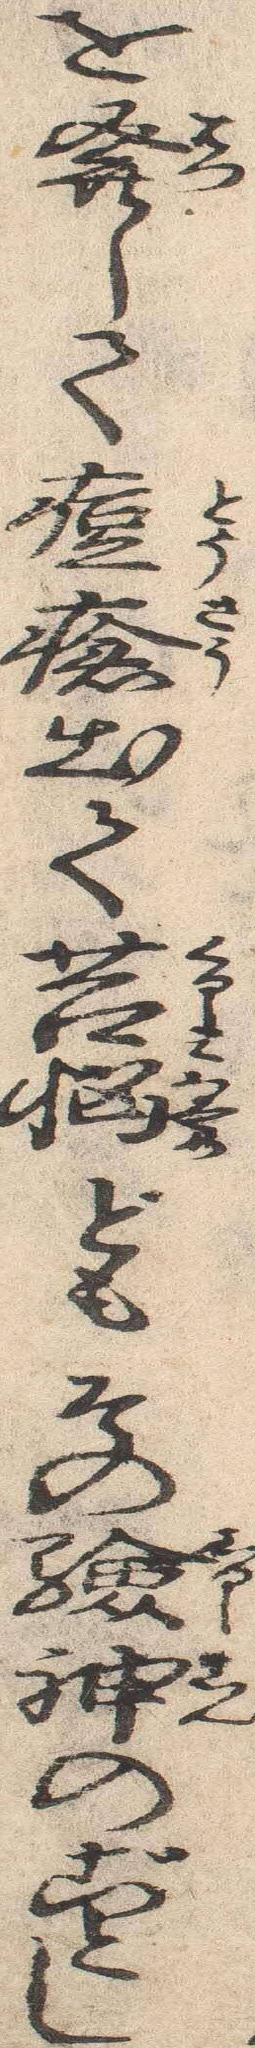を発して痘瘡出て苦悩どもその験神のごとし
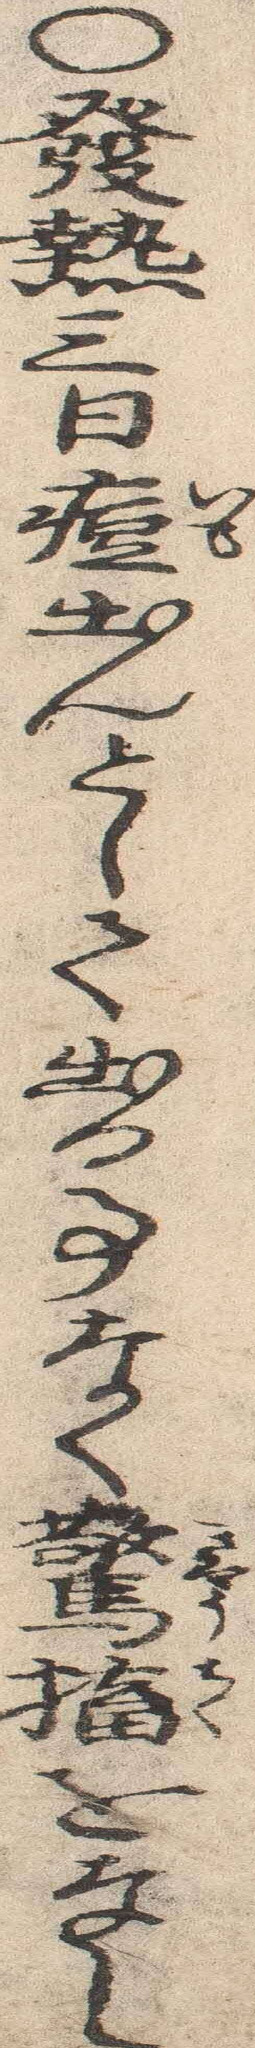○発熱三日痘出んとして出る事なく驚搐をなし
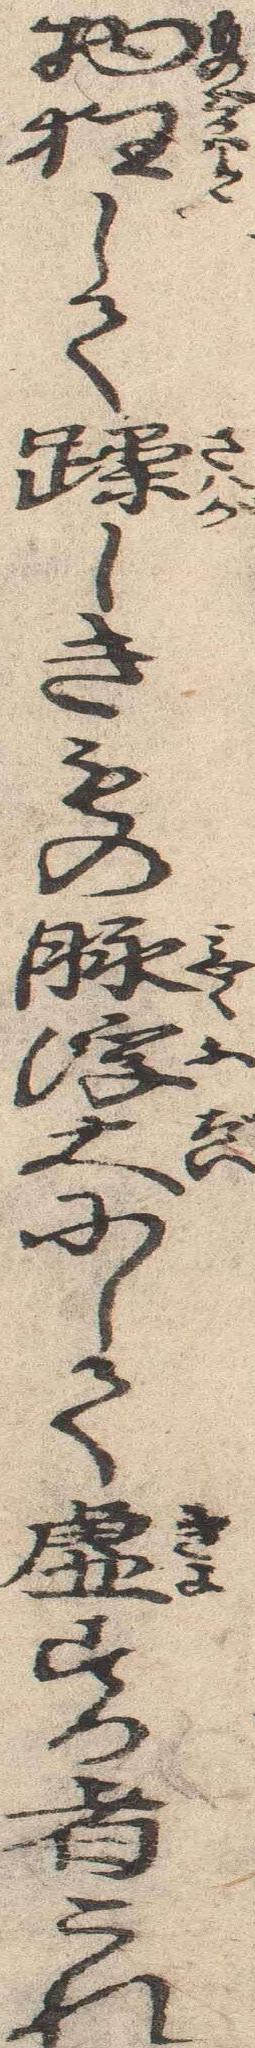物狂して躁しきもの脈浮大にして虚する者これ
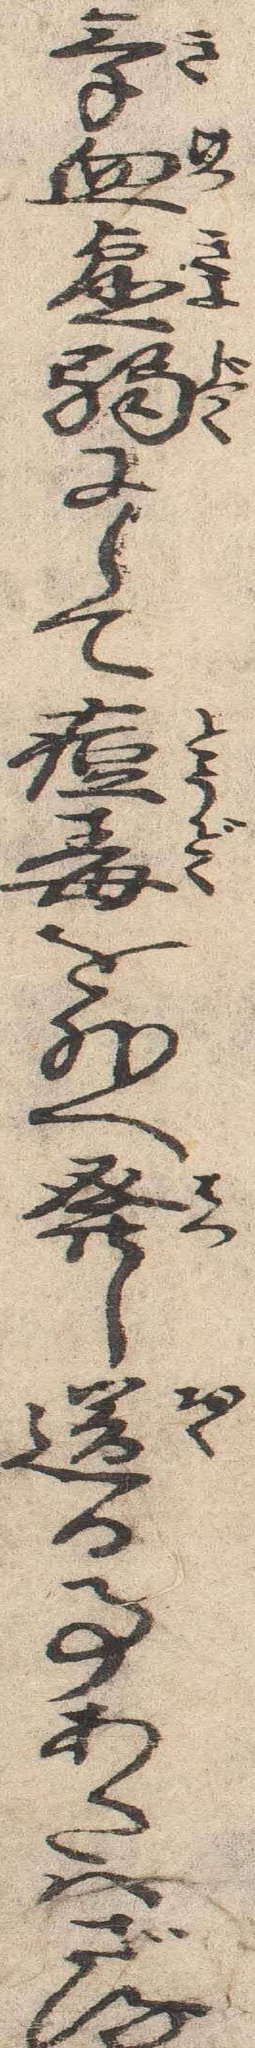気血虚弱にして痘毒を外へ発し送る事あたはざる
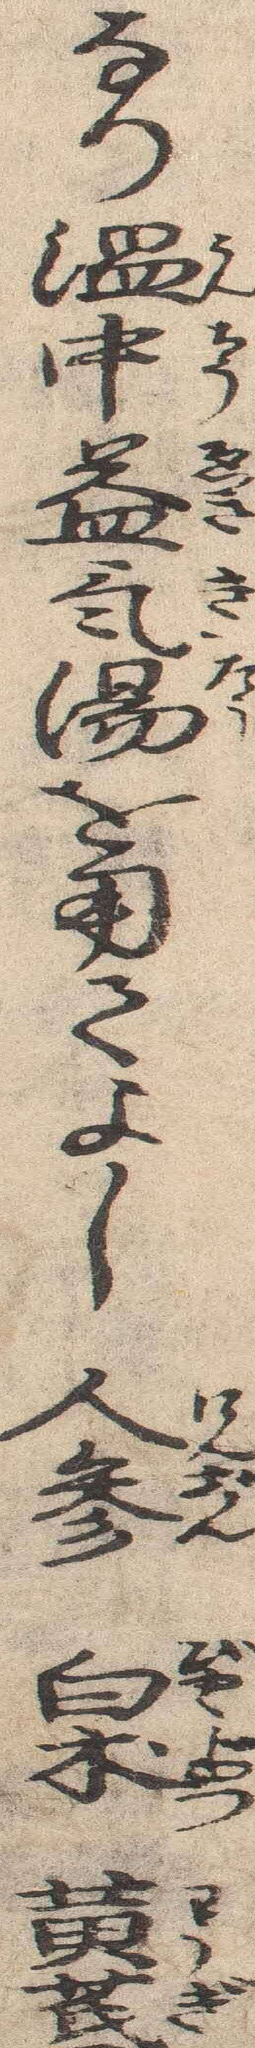なり温中益気湯を用てよし人参白朮黄茋

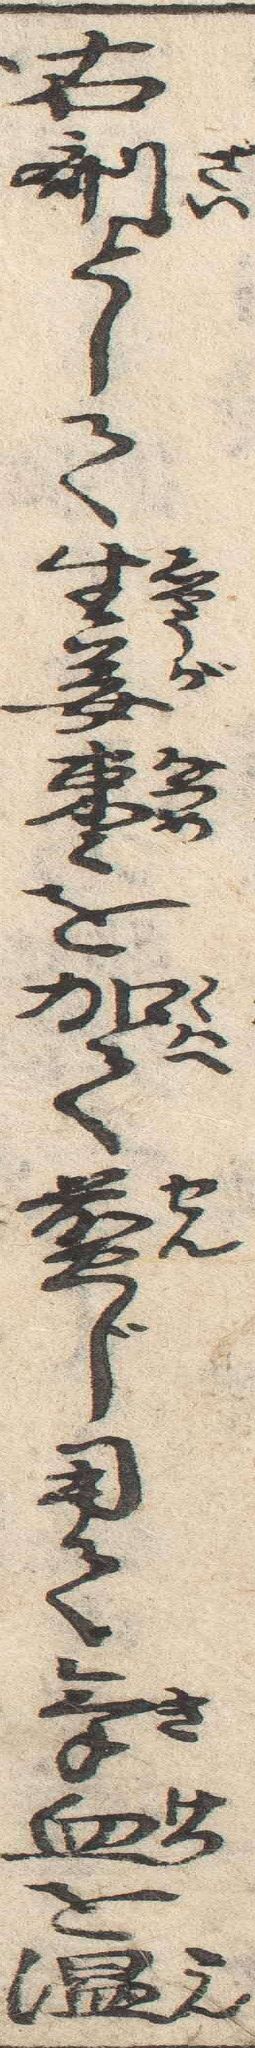右剤として生姜棗を加て煎じ用て気血を温
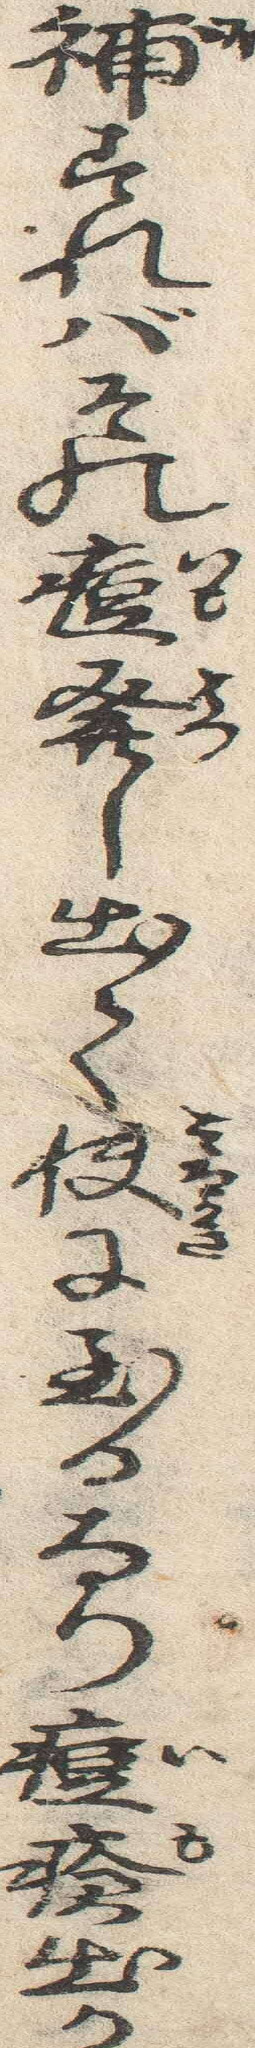補すればその痘発し出て快に至るなり痘瘡出か
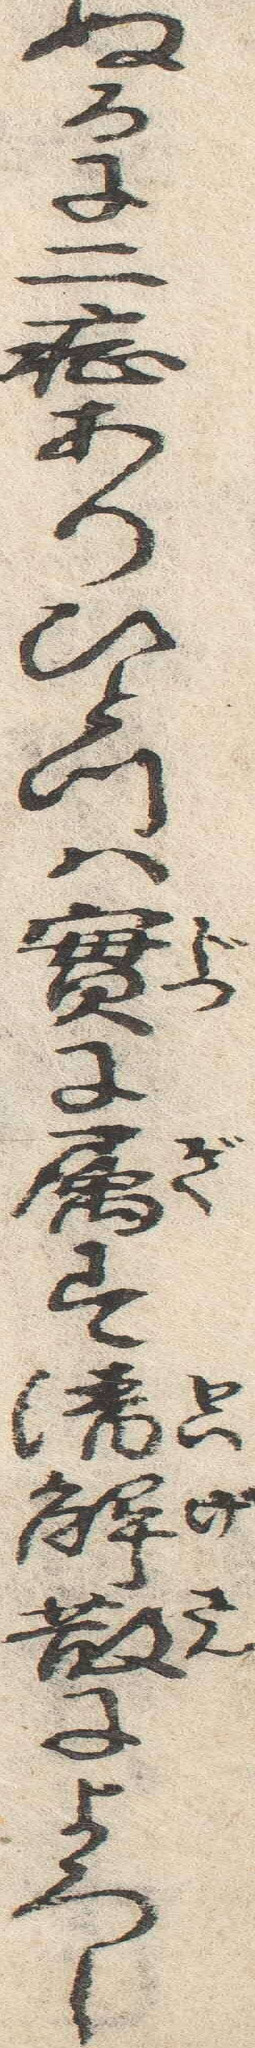ぬるに二症ありひとつは実に属す清解散によろし
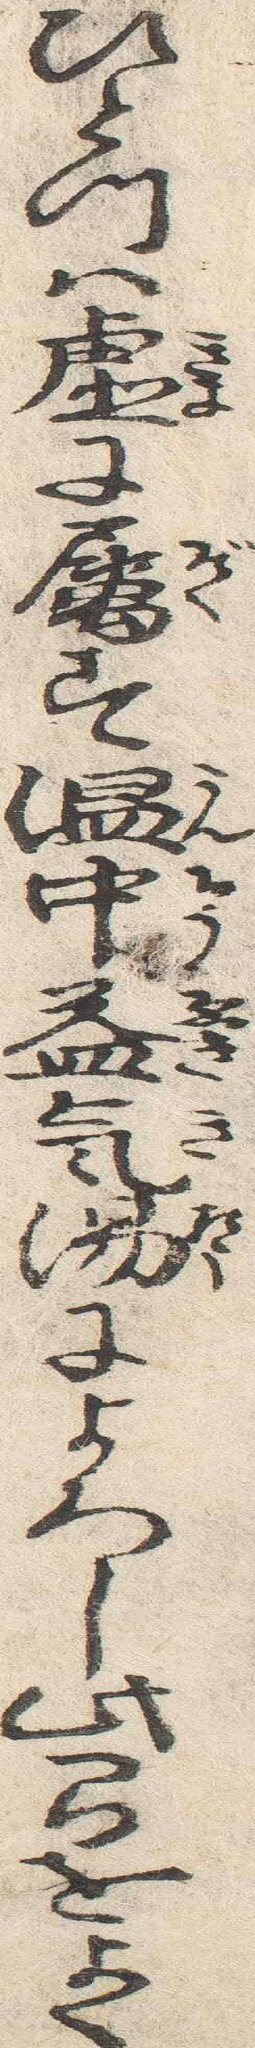ひとつは虚に属す温中益気湯によろし此間をよく
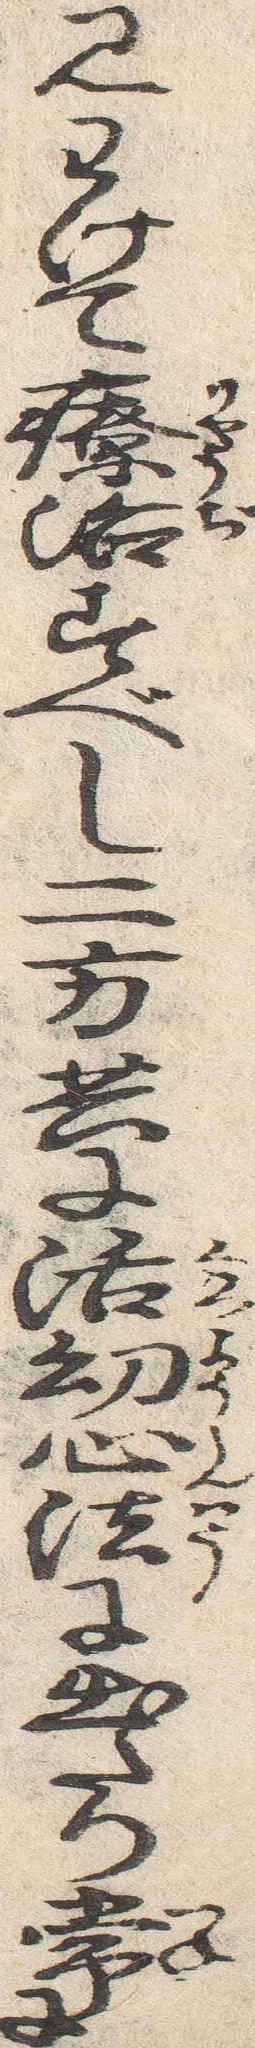見わけて療治すべし二方共に活幼心法に出たり常に
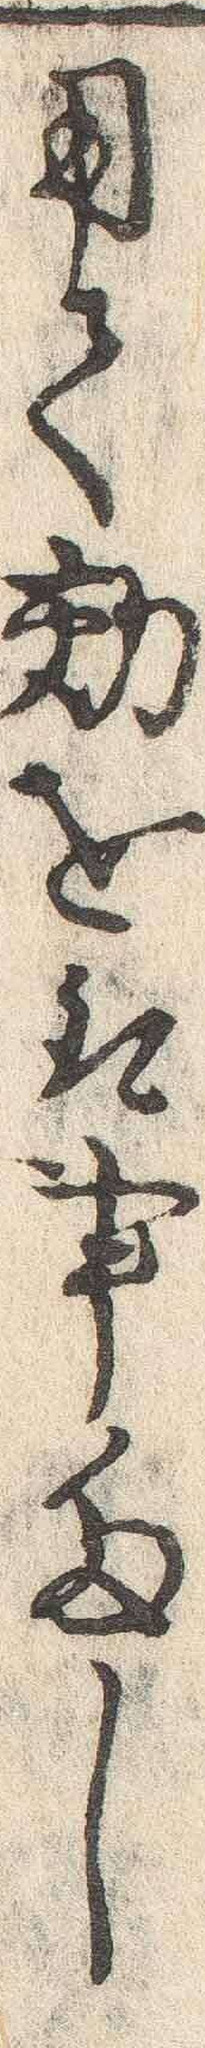用て効を取事多し
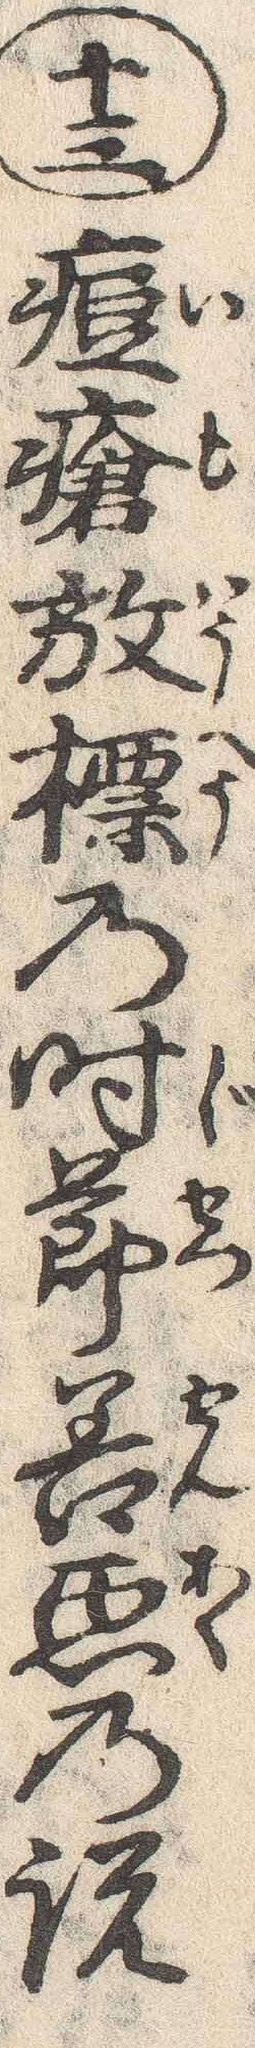(十三)痘瘡放標の時節善悪の説
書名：小児必用養育草
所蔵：東京学芸大学附属図書館 国文学研究資料館
